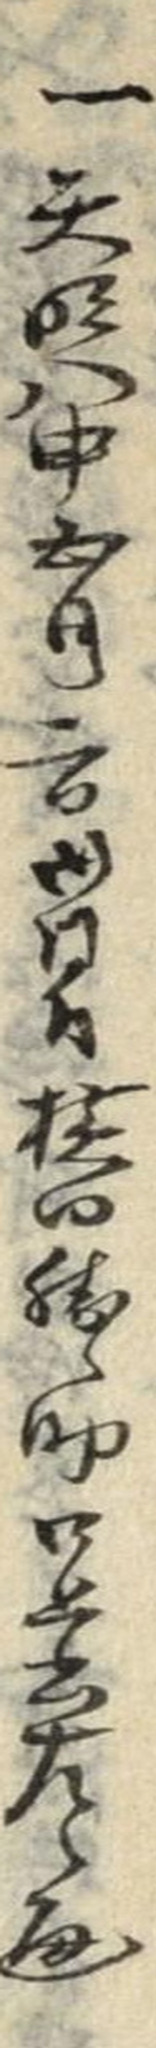一天明八申五月二日御目付横田勝之助口上書左之通
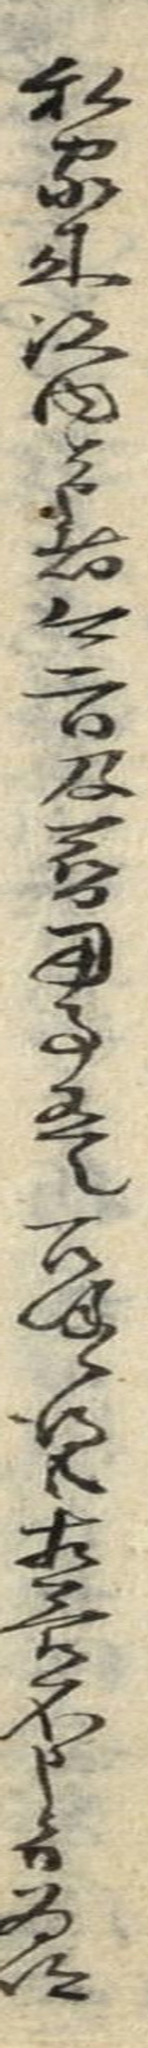私家来沢内と申者今二日及暮用事有之召呼候得共相答不申に付為吟
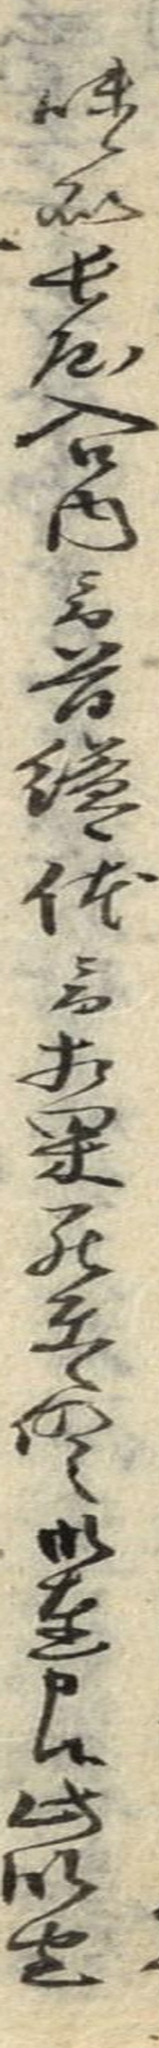味候処長屋入口内にて首縊候体にて相果罷在候仍之御達申候此段宜
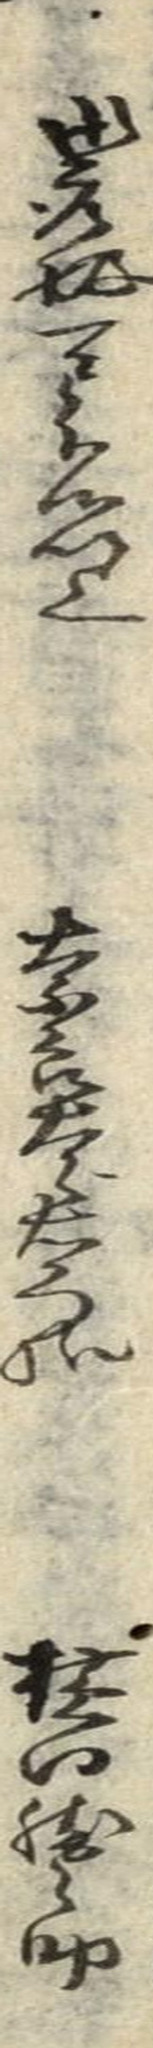御取扱可被下候以上奈良太郎右衛門様横田勝之助
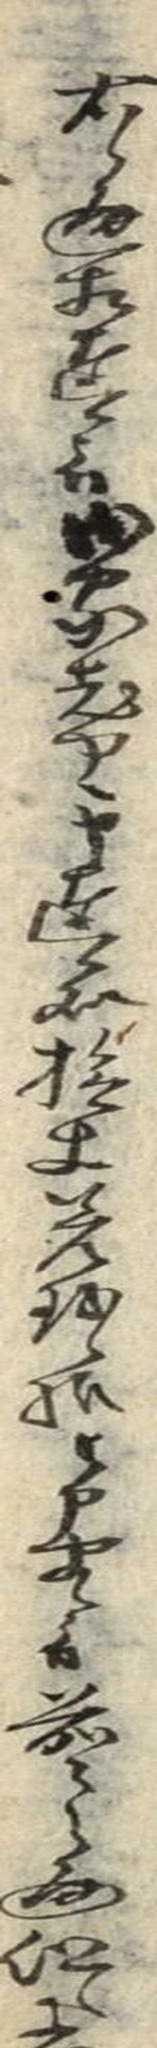右之通相達候に付御家老中へ申達候処検使差越候様被申聞候に付前々之通組之者
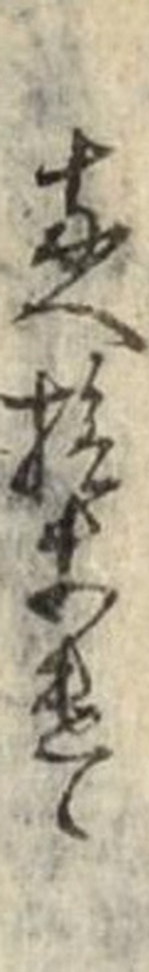両人検使遣候
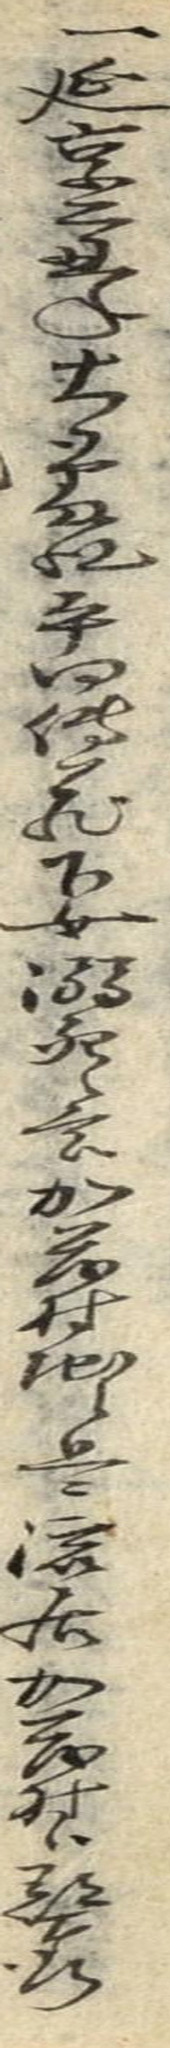一延享二丑年大御番組平田伝蔵下女溺死之節加茂村地之上に流居加茂村は郡奉行
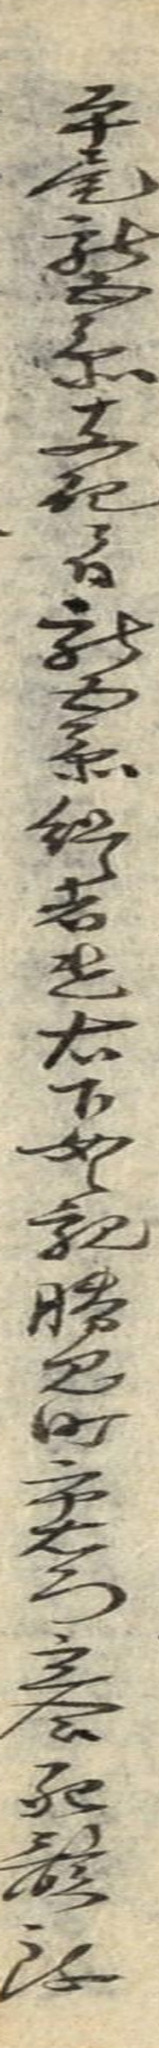平尾新五兵衛支配に付新五兵衛組之者遣右下女之親勝見町市右衛門立合死骸致
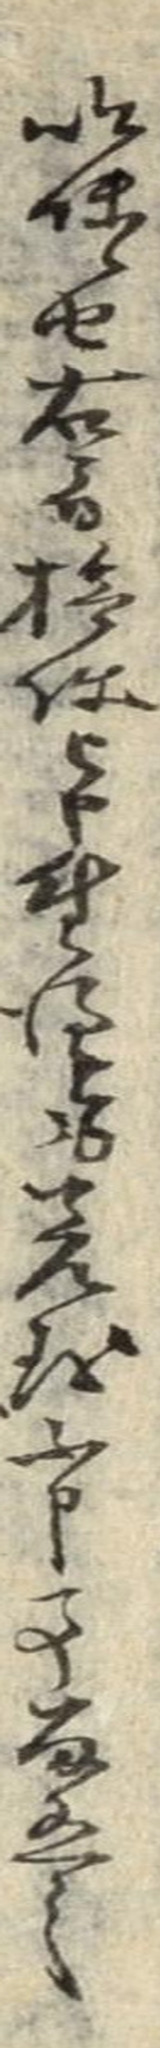吟味候由右に付検使被申付候得とも差越不申事留有之
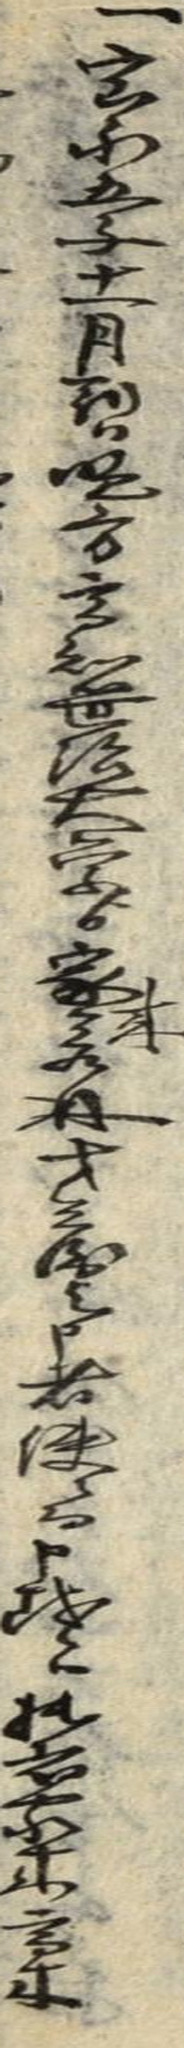一宝永五子十一月朔日晩方高知笹治大学ゟ家来若林才兵衛と申者使にて申越候は拙者家来高木
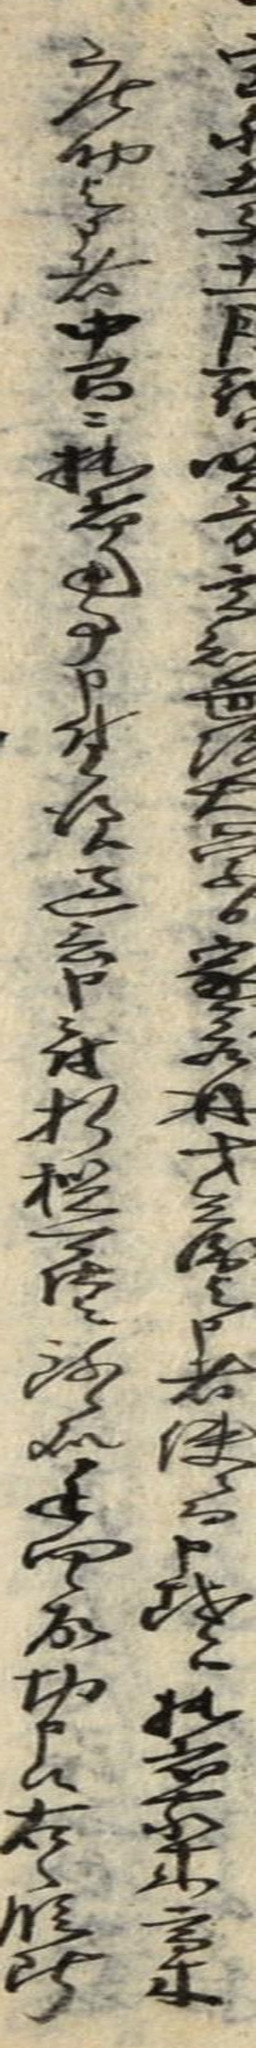庄助と申者中間に拙者用事申付候得は過言申に付折檻可仕と致候処手向候故切申候右之段断

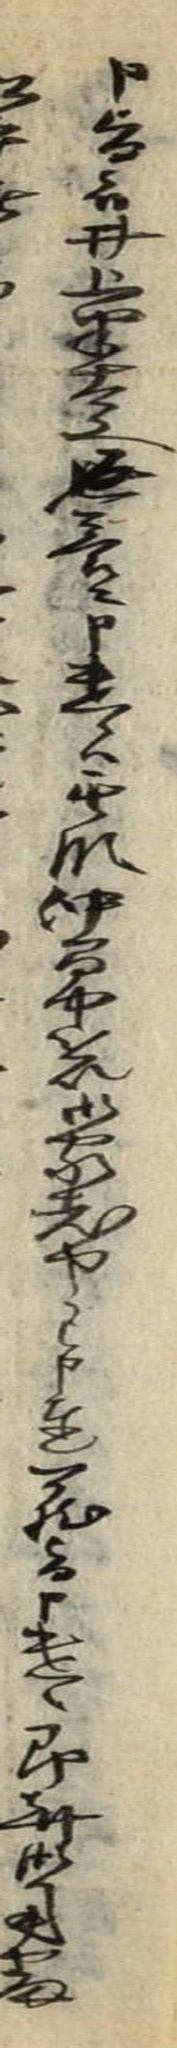申旨に付井上半大夫返答に申遣候は其段仲間中を以御家老中へ被申達可然旨申遣候即刻御用番
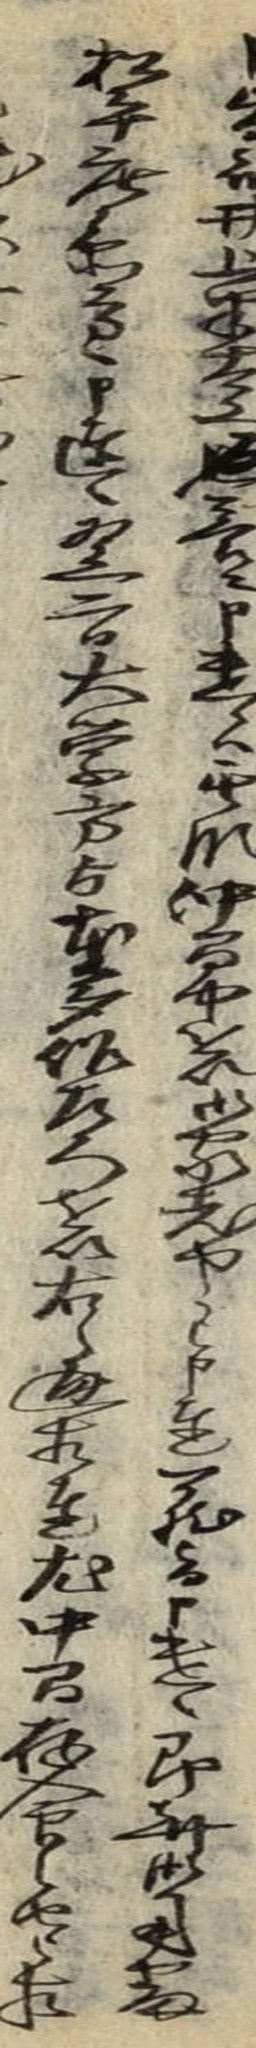松平庄兵衛方へ申達候翌二日大学方ゟ本多作左衛門を以右之通相達尤中間存命之由と相
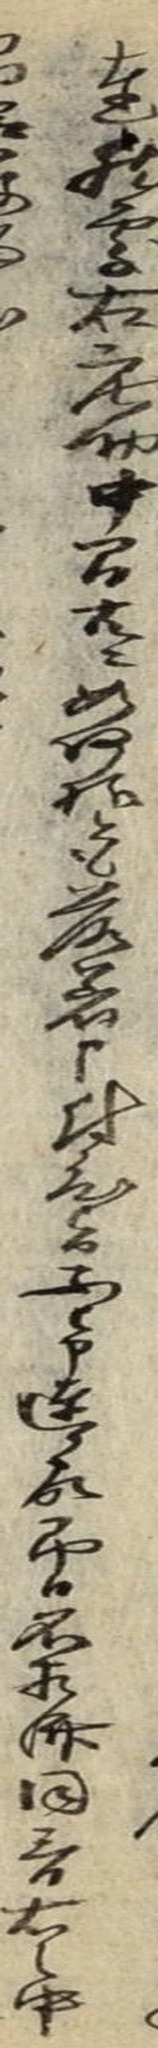達候然処右庄助中間共に如何様とも落着申付度旨不被申達候故即日不相済同三日右之中
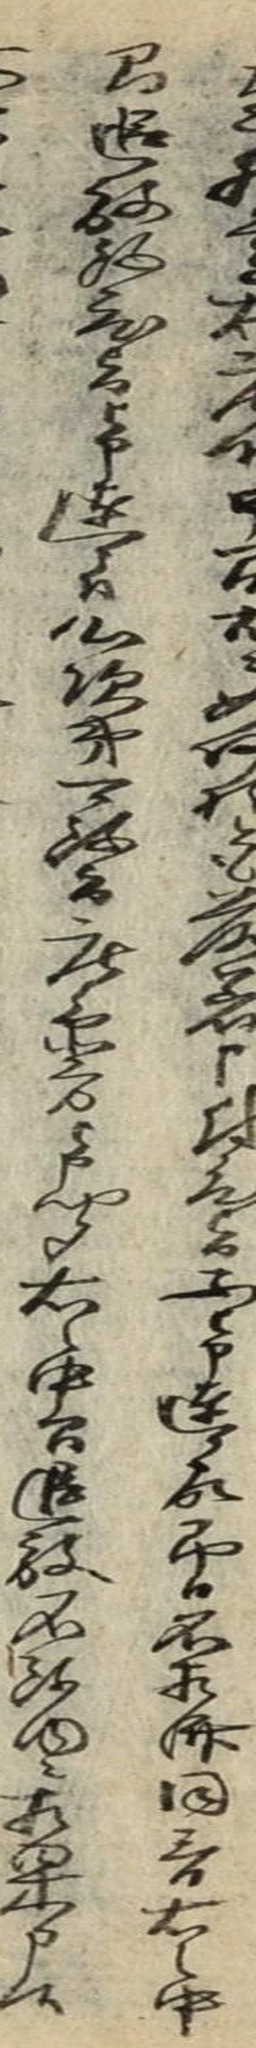間追放致度旨被申達候付心次第可致旨庄兵衛方被申聞右之中間追放不致内に相果申候
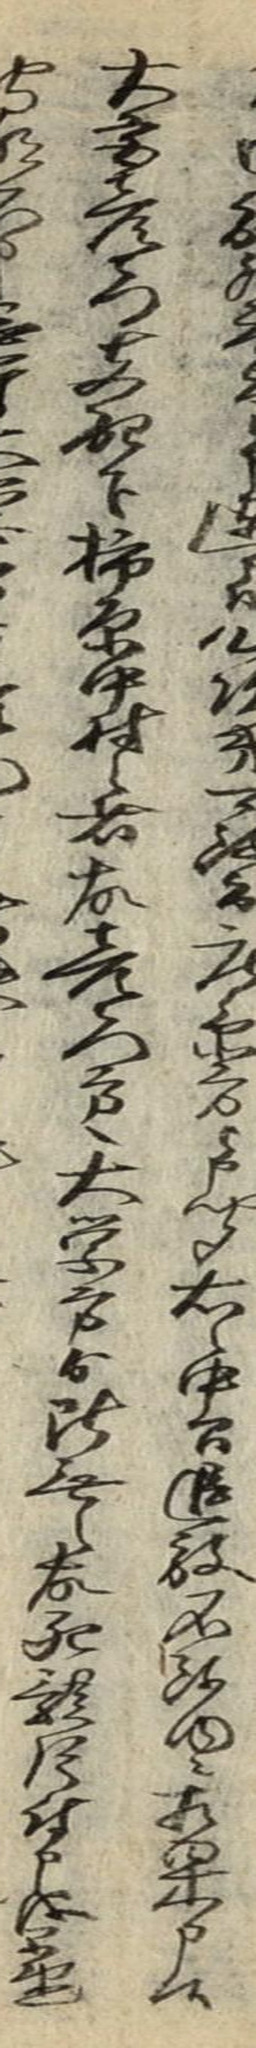大宮彦右衛門支配下柿原中村之者故彦右衛門方へ大学方ゟ断無之故死骸片付申儀早速
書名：御停止異変死失
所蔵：福井県文書館 Fukui Prefectural Archives
